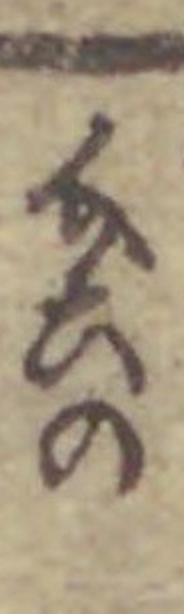介六の
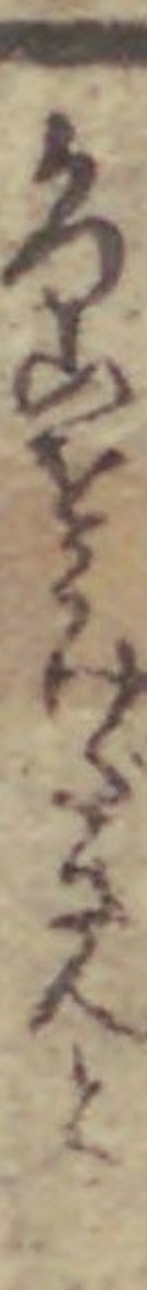かつ山をうけださんと
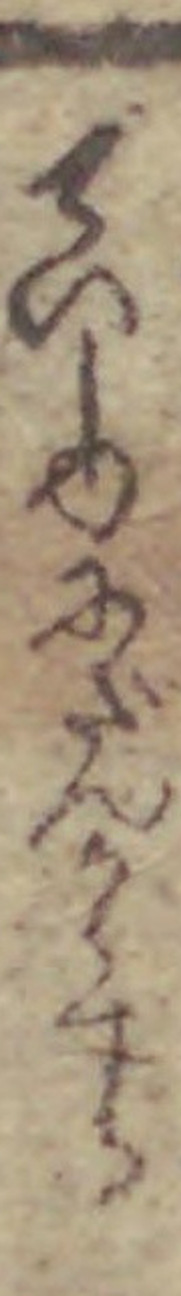ていしゆにだんかうする
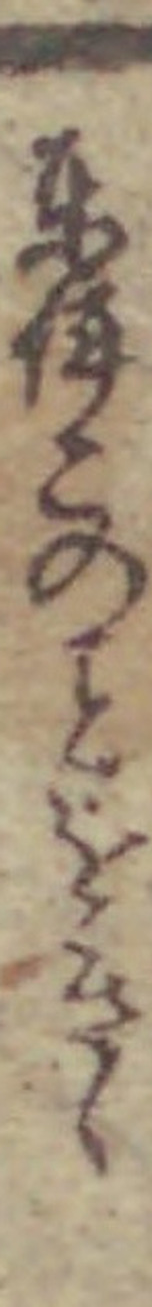東伊このことをきゝ
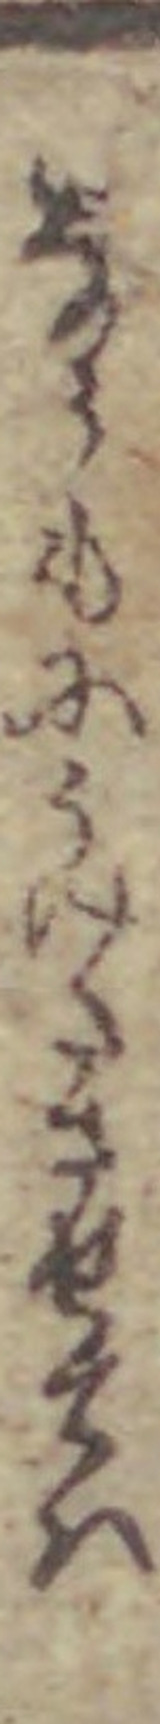ならもにうけたされては
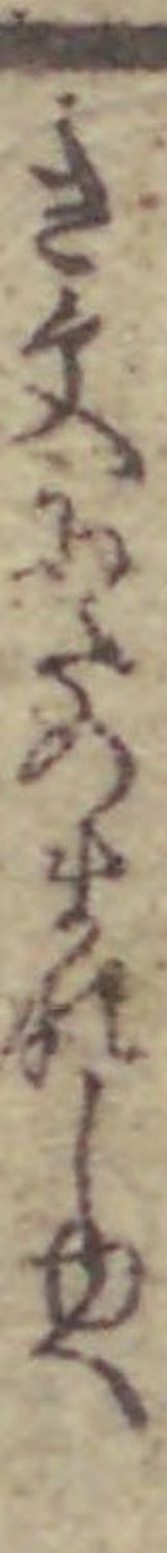き文にたのまれしゆへ
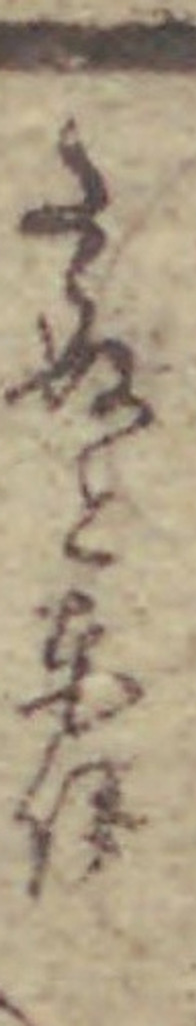たゝぬと東伊
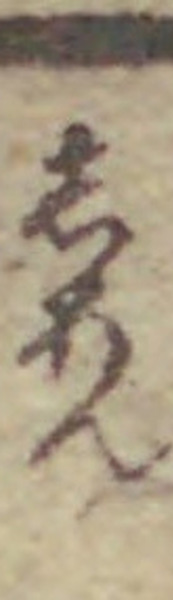しあん
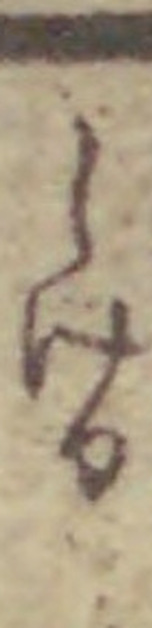しける
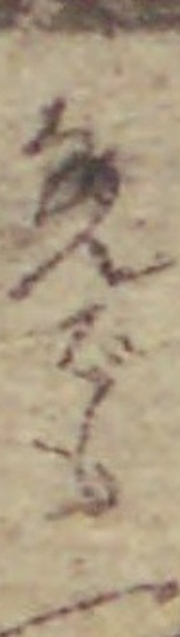なんでも
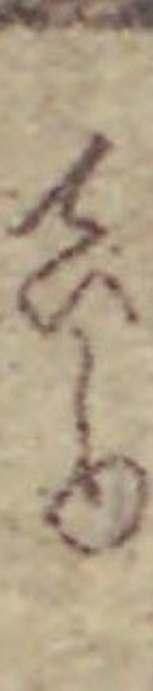ていしゆ
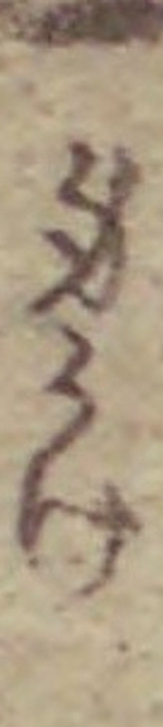身うけ
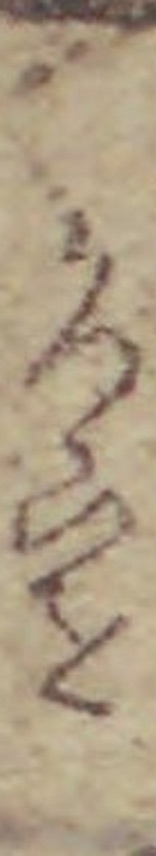かつ山を
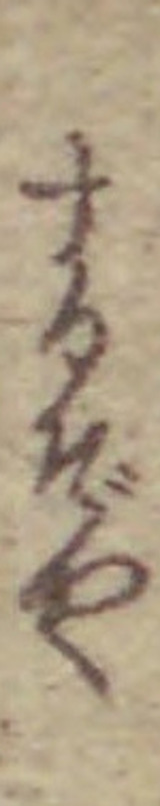するぞや

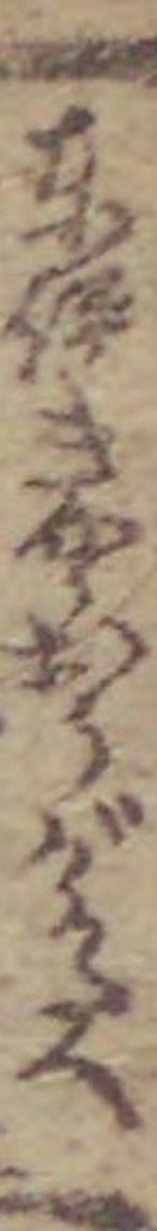東伊きやうおうがかたへ
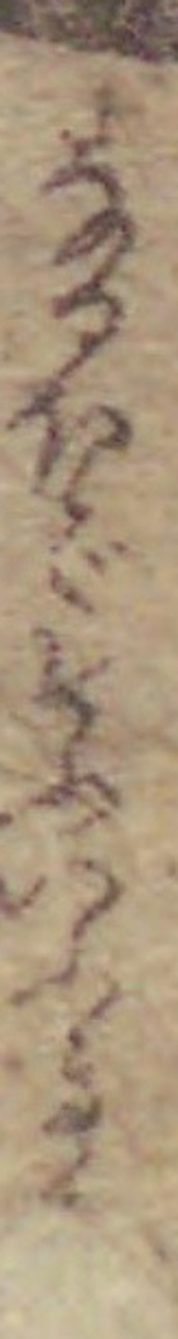なるほどそふいふ……
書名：大通其面影 2巻
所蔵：国立国会図書館 National Diet Library, JAPAN
